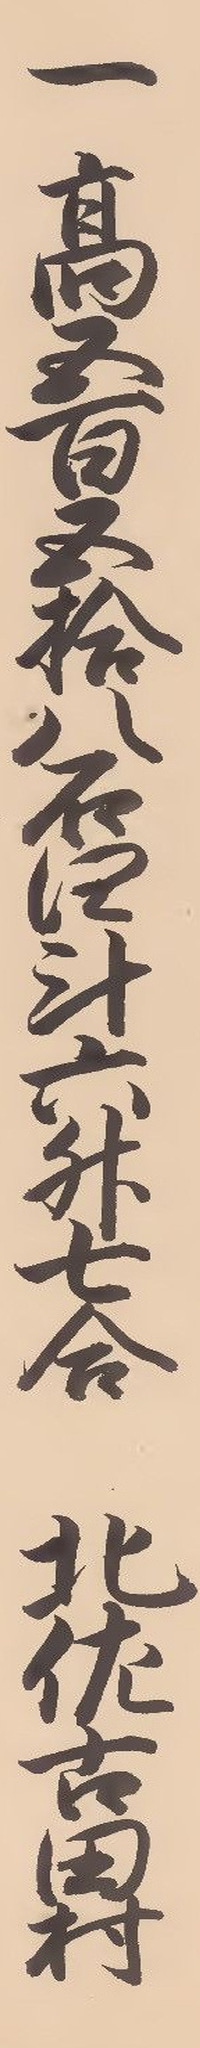一髙五百五拾八石四斗六升七合北佐古田村
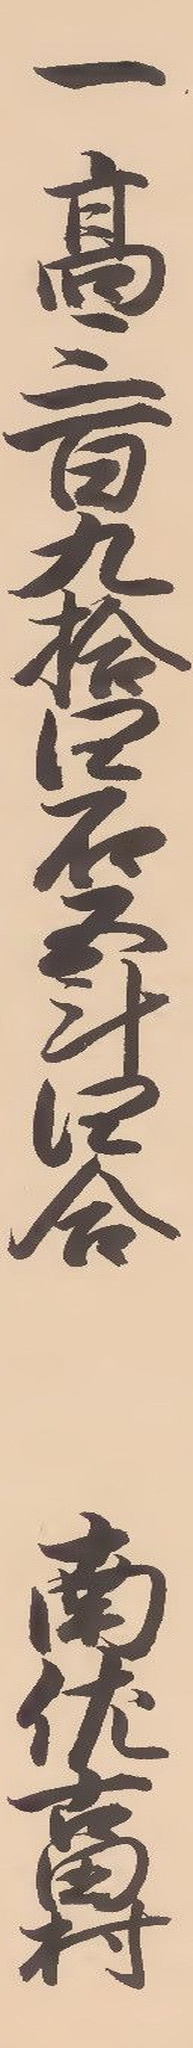一髙三百九拾四石五斗四合南佐古田村
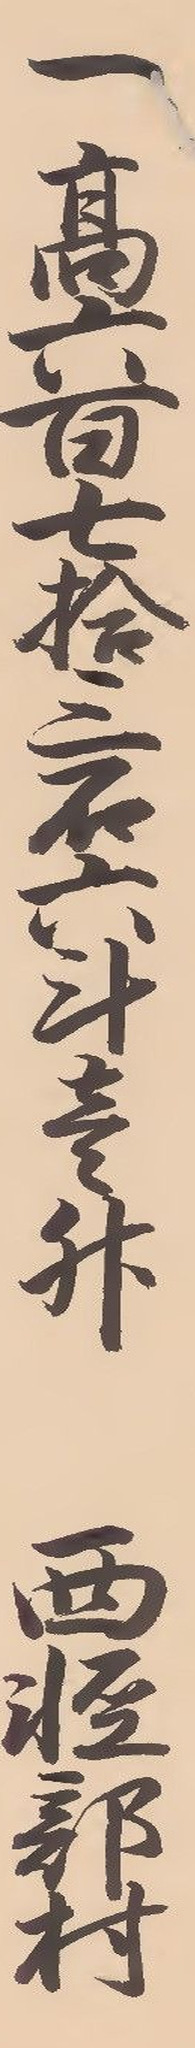一髙六百七拾三石六斗壱升西輕部村
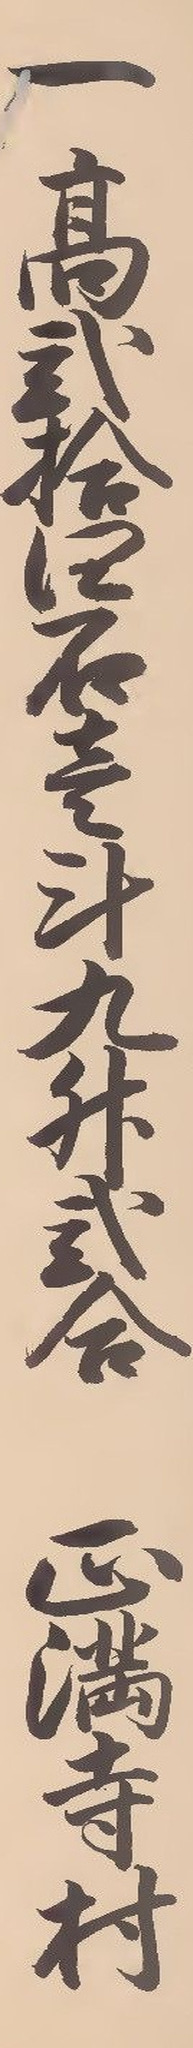一髙弐拾四石壱斗九升弐合正満寺村
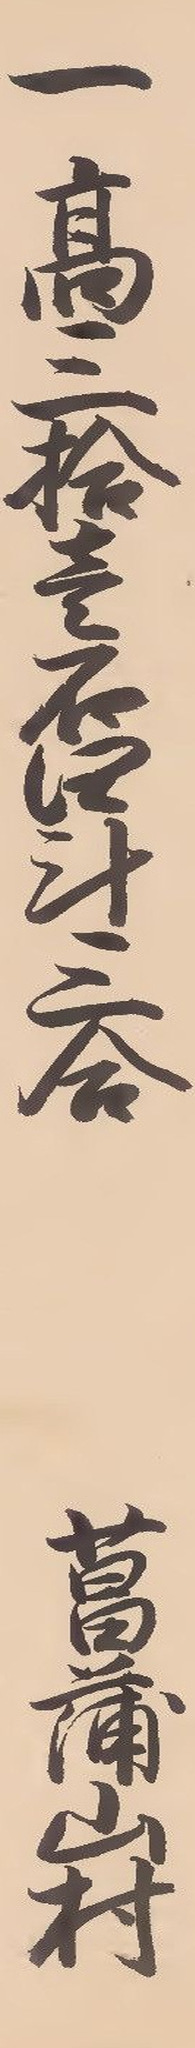一髙三拾壱石四斗三合菖蒲山村
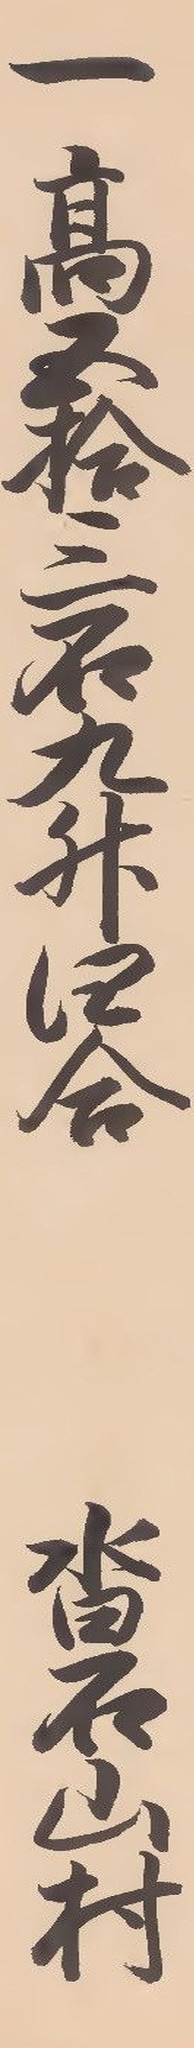一髙五拾三石九升四合沓石山村
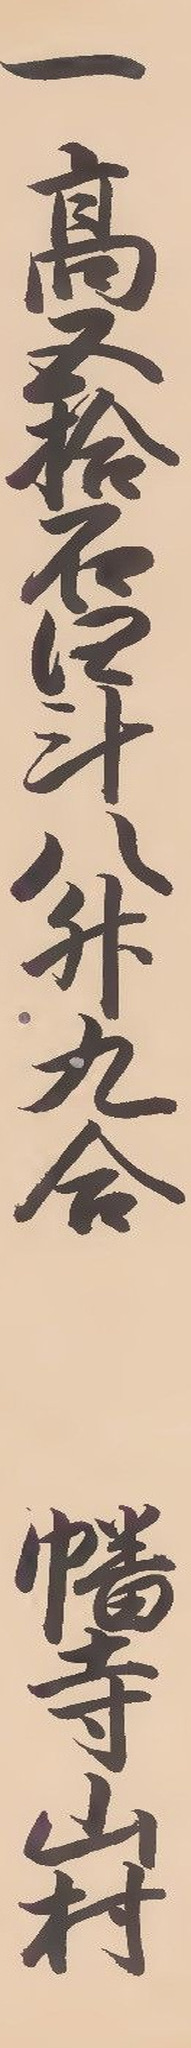一髙五拾石四斗八升九合幡寺山村

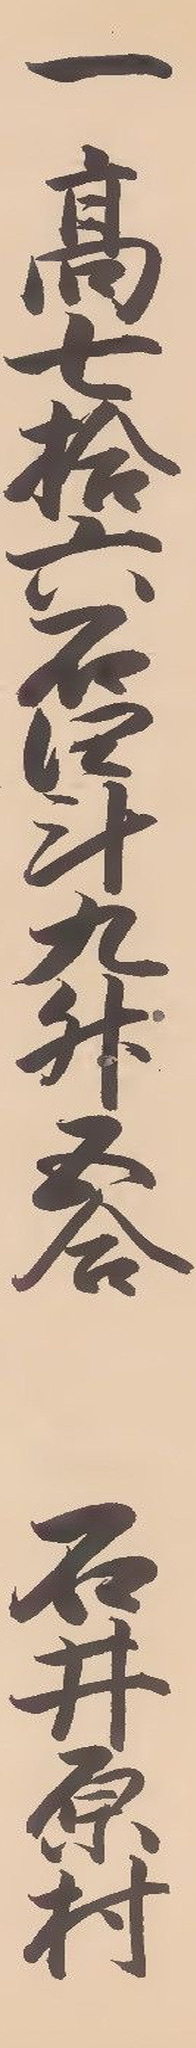一髙七拾六石四斗九升五合石井原村
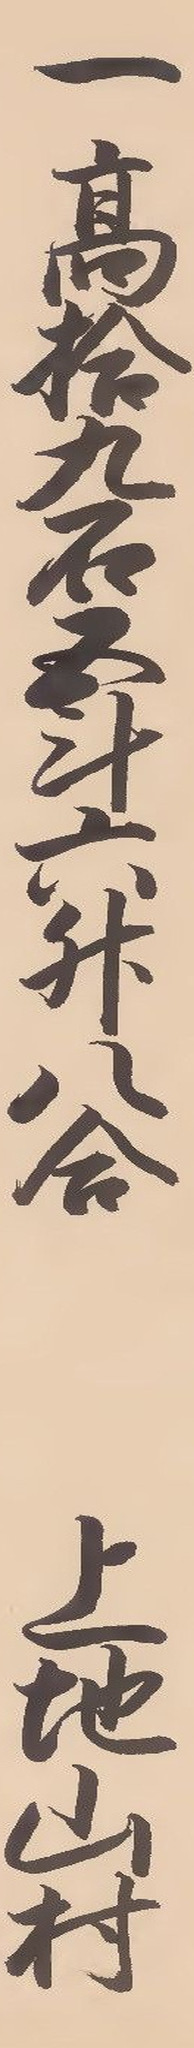一髙拾九石五斗六升八合上地山村
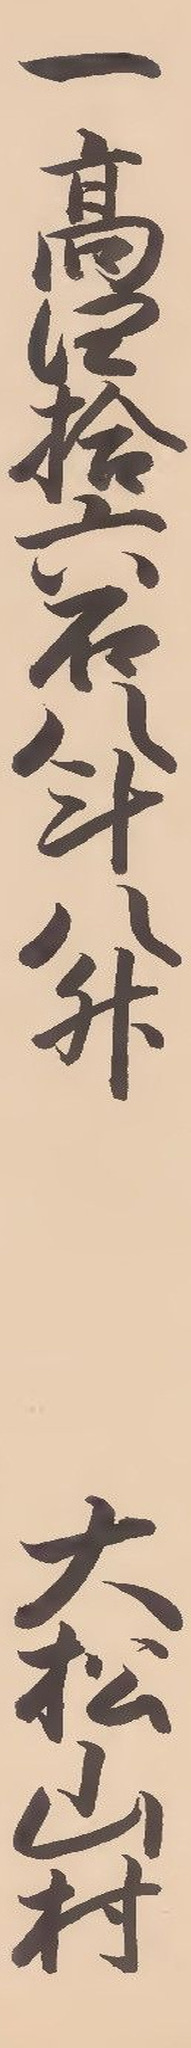一髙四拾六石八斗八升大松山村
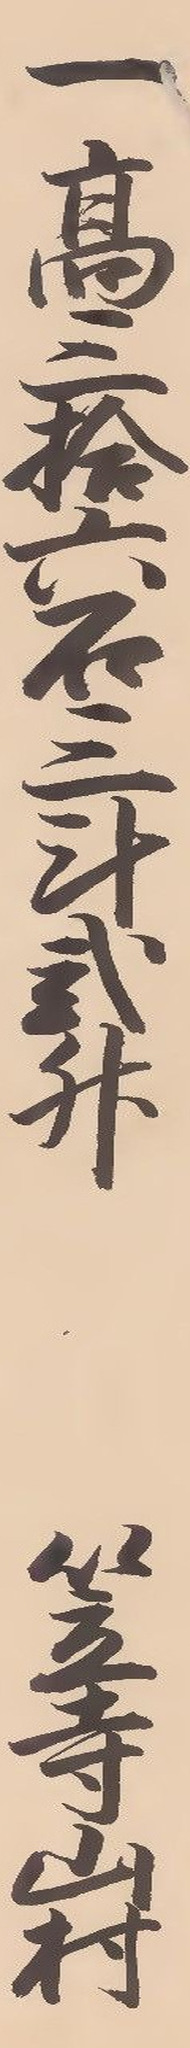一髙三拾六石三斗弐升笠寺山村
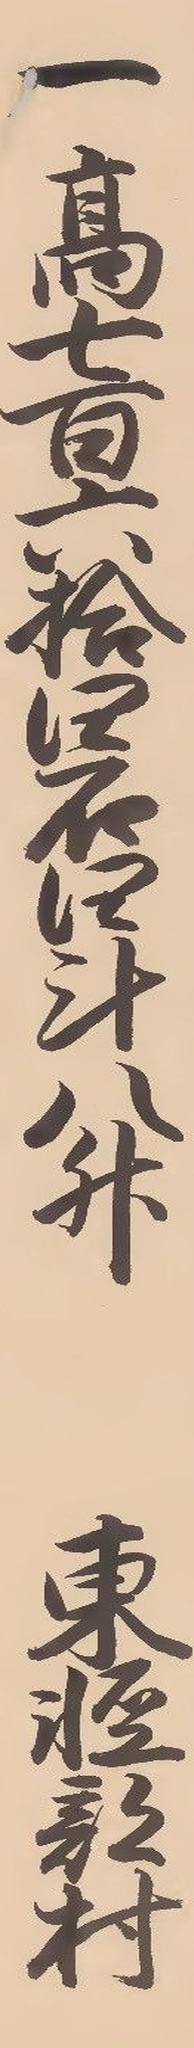一髙七百六拾四石四斗八升東輕部村
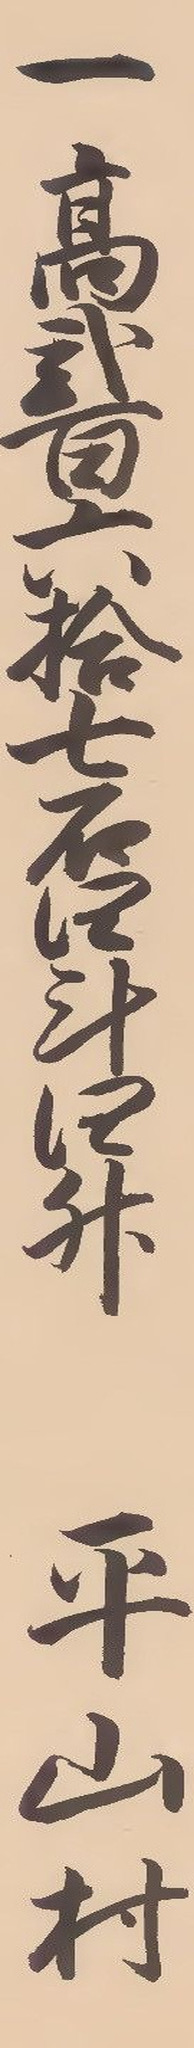一髙弐百六拾七石四斗四升平山村
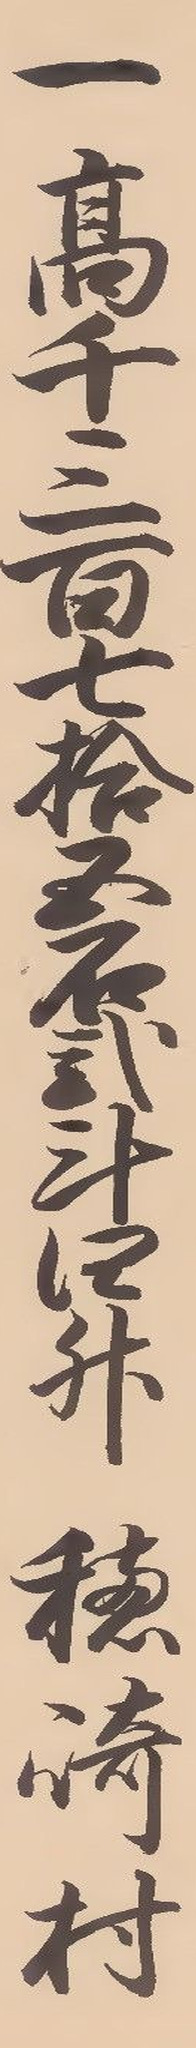一髙千三百七拾五石弐斗四升穂崎村
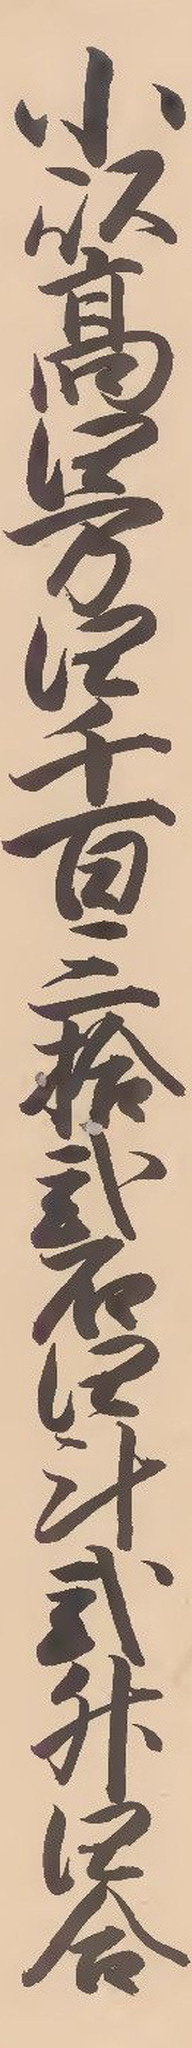小以髙四万四千百三拾弐石四斗弐升四合

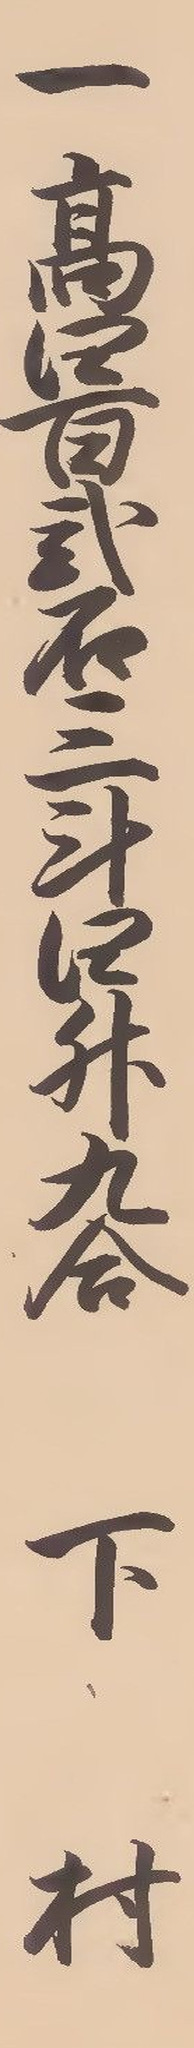一髙四百弐石三斗四升九合下村
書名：備前国郷帳
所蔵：国立公文書館 National Archives of Japan
